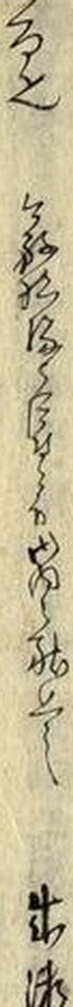金百疋今般結講被仰付候ニ付御内々献上之
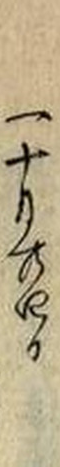一十月廿四日
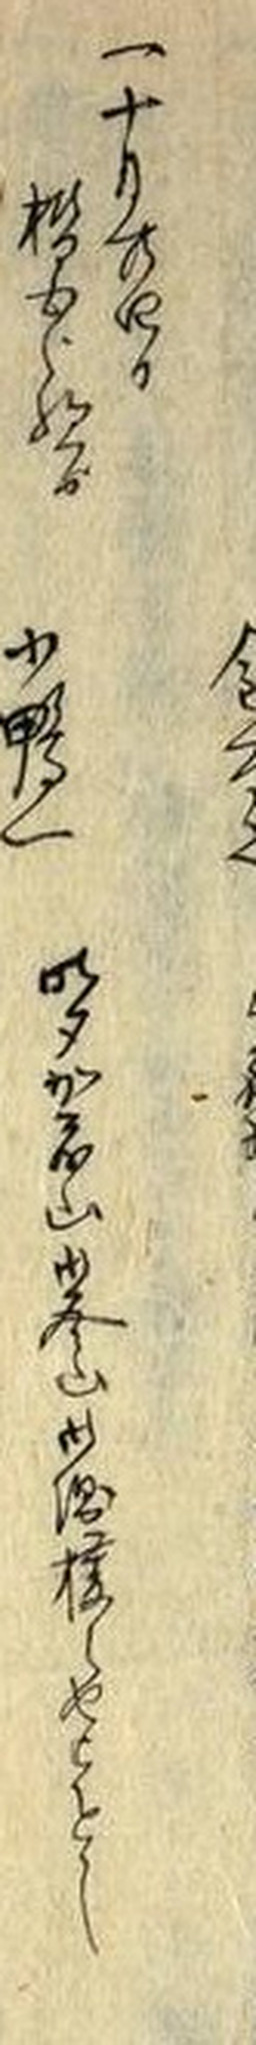揩五郎様ゟ小鴨一昨夕加茂山御登山御側獲之由被進之
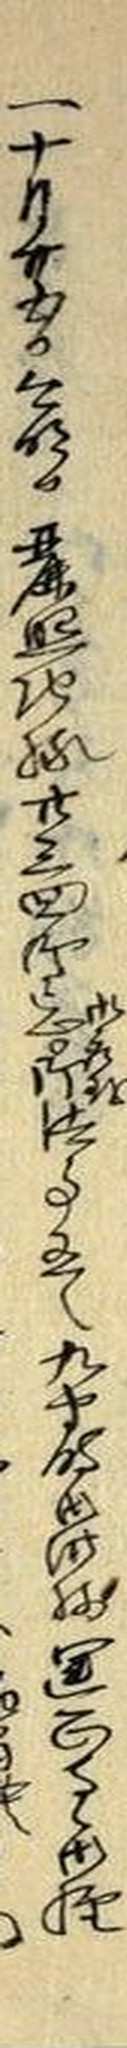一十月廿五日今朝ゟ麗照院様廿三回御忌御取越御法事有之九半時御供揃運正寺へ御経
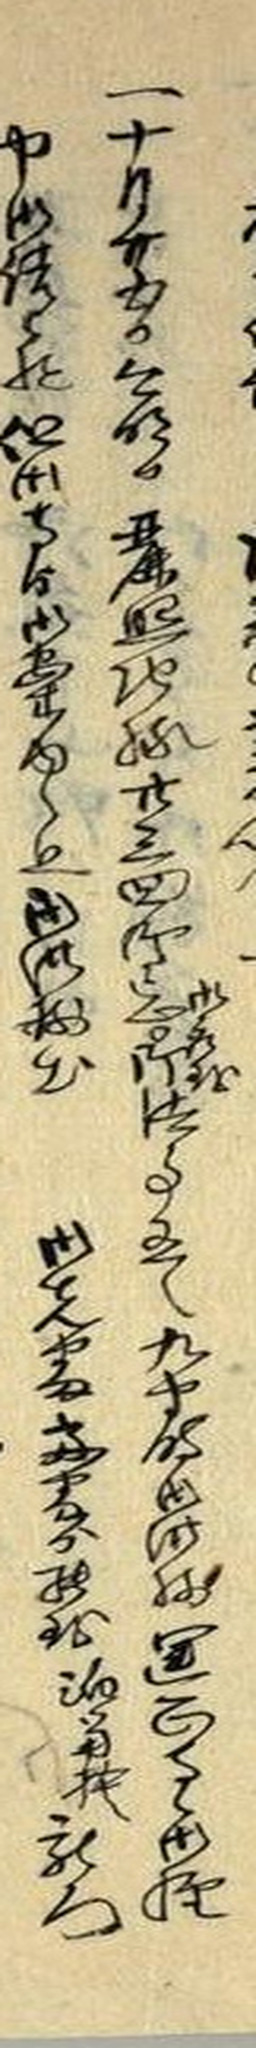中御詰被遊但御寺ゟ御案内之上御供揃出御先番当番ゟ罷越泊御用捨新右衛門
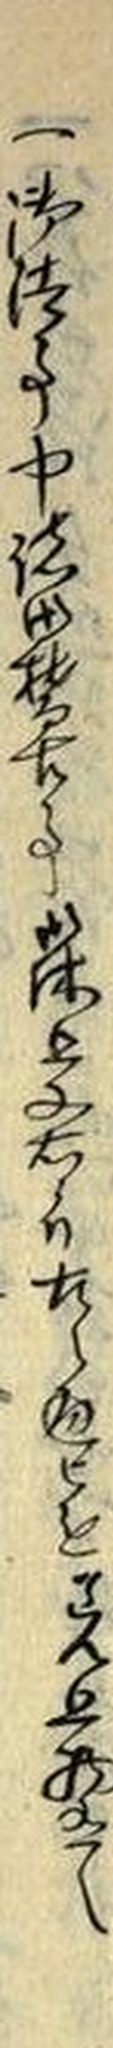一御法事中諸御稽古事御休且又右ニ付左之通被進差上物有之
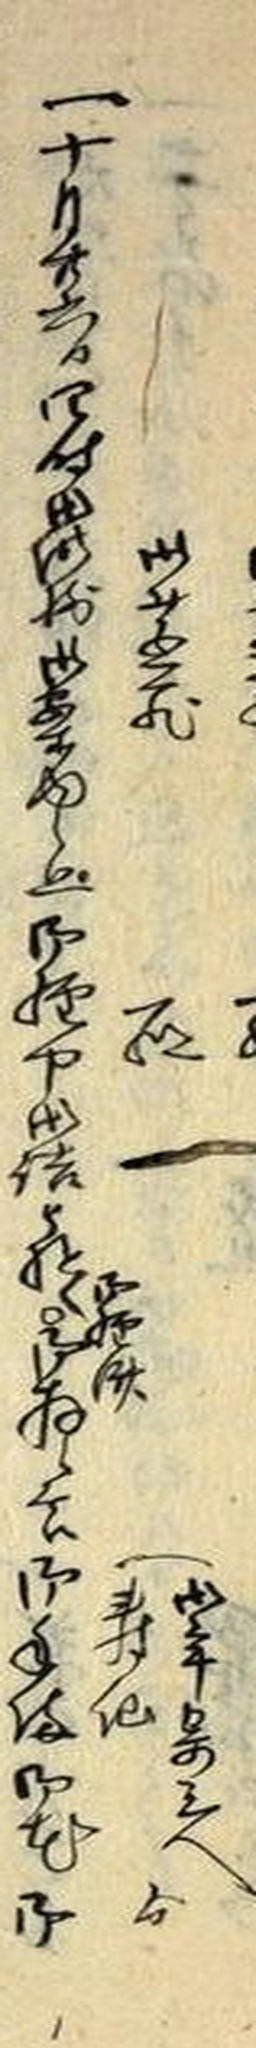一十月廿六日四時御供揃御案内之上御経中御詰被遊候御経済御拝候節御手備御花御
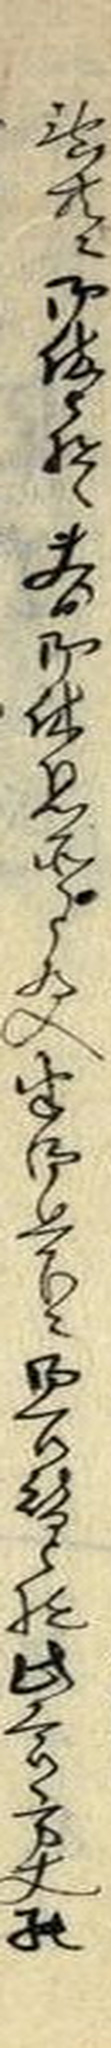台共ニ御備被遊候夫ゟ御休息所へ被為入半御上下ニ御召替被遊此節方丈罷
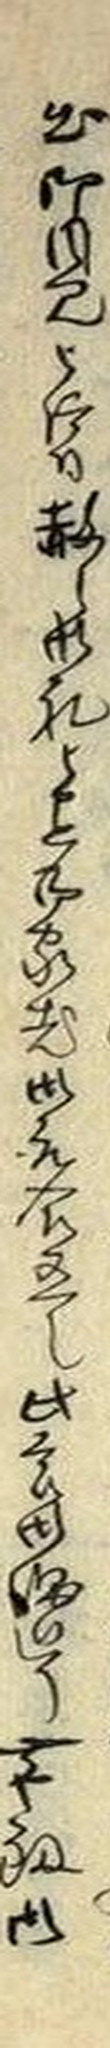出御目見被仰付赦之御礼被申上御家老御取合有之此節御側廻り帯釼御
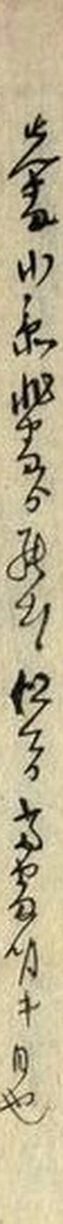先番小兵衛非番ゟ罷出候但今日当番明キ日也
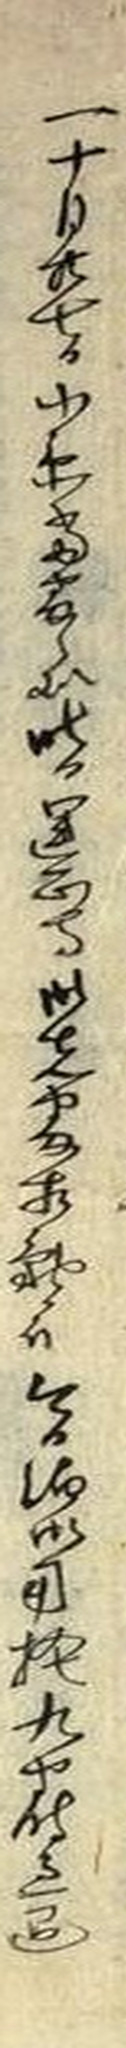一十月廿七日小兵衛当番之処昨日運正寺御先番相勤候付今日泊御用捨九半時過退
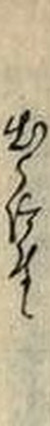出被仰付候
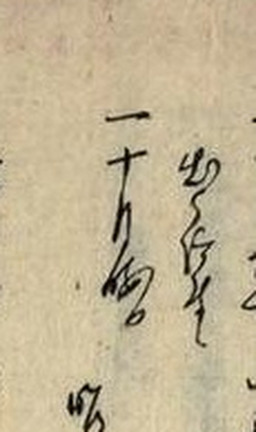一十月晦日
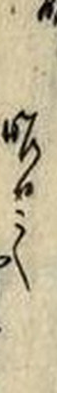昨日之
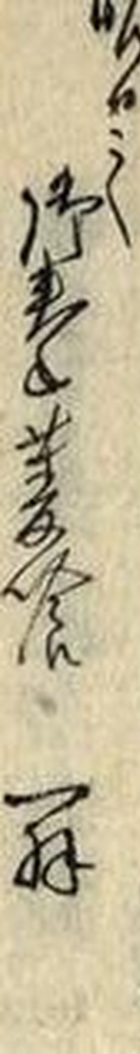御拳菱喰一羽
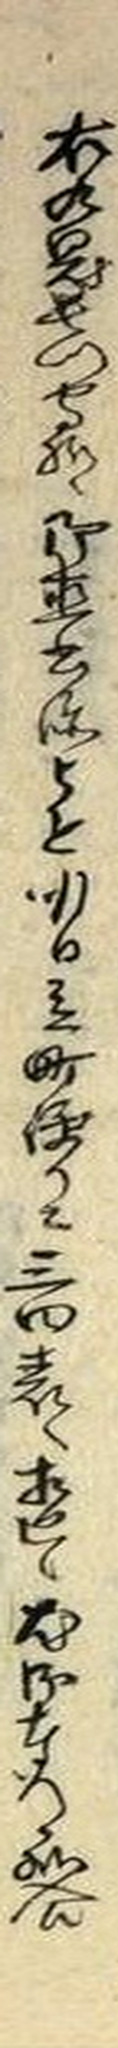右九鬼長門守様へ御直書添被進明日立町便りニ三田表へ相廻候尤御奉行へ掛合
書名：少傅日録抄（斉承付側向頭取日記、在国）
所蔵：福井県文書館 Fukui Prefectural Archives
